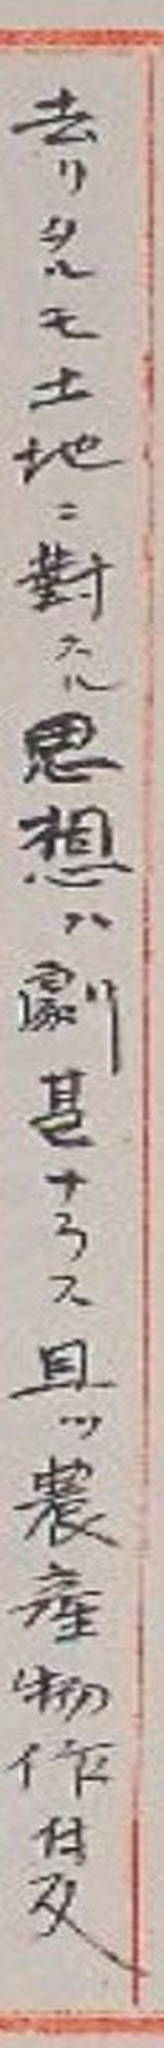去リタルモ土地ニ対スル思想ハ劇甚ナラス且ツ農産物作付反
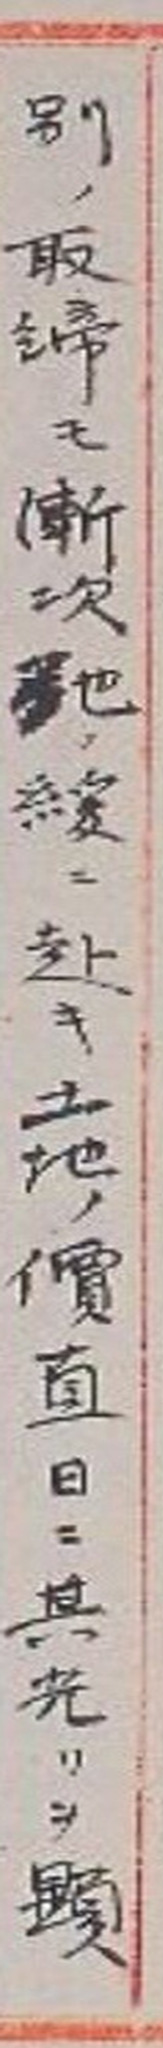別ノ取締モ漸次弛緩ニ赴キ土地ノ価直日ニ其光リヲ顕
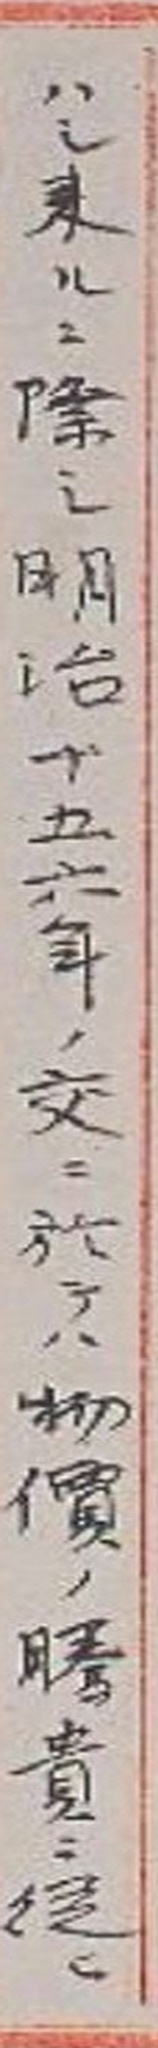ハシ来ルニ際シ明治十五六年ノ交ニ於テハ物価ノ騰貴ニ従ヒ
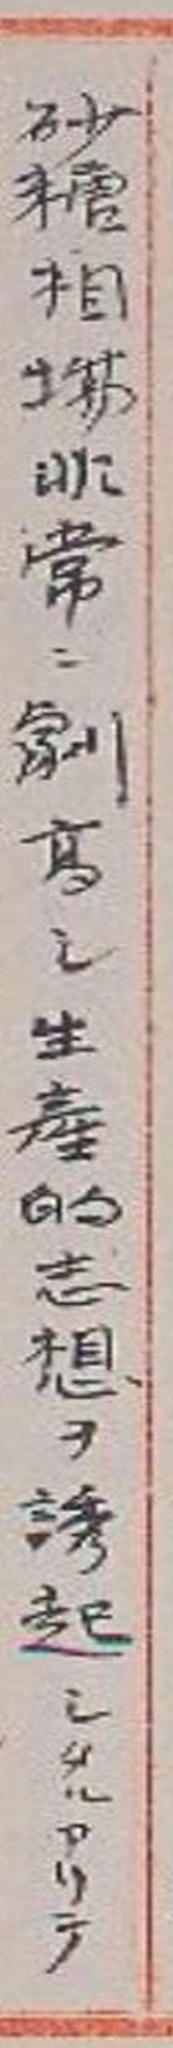砂糖相場非常ニ劇高シ生産的志想ヲ誘起シタルアリテ

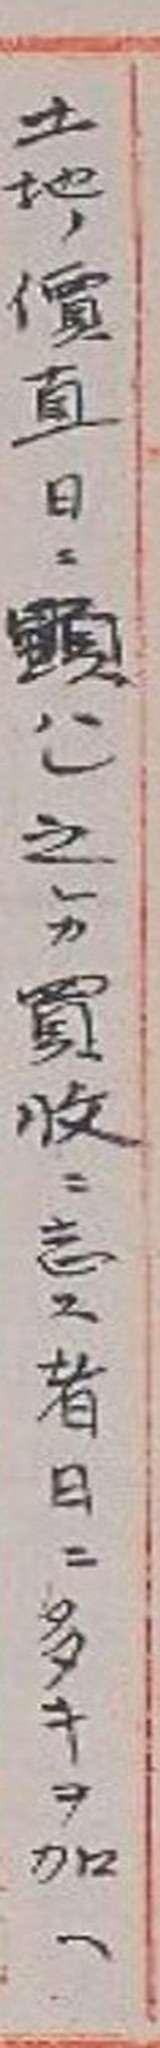土地ノ価直日ニ顕ハレ之レカ買収ニ志ス者日ニ多キヲ加ヘ
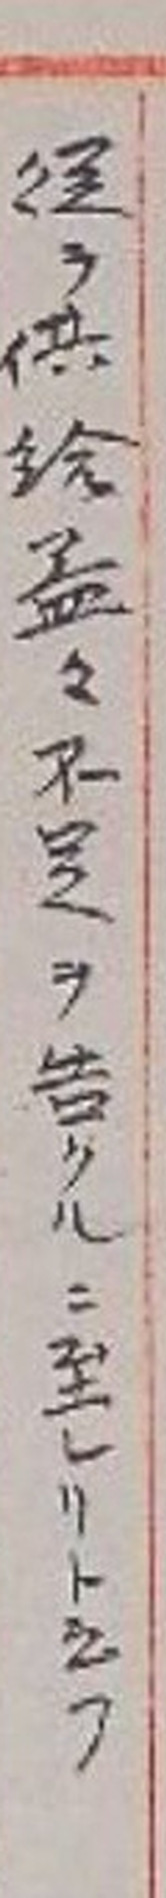従テ供給益々不足ヲ告クルニ至レリト云フ
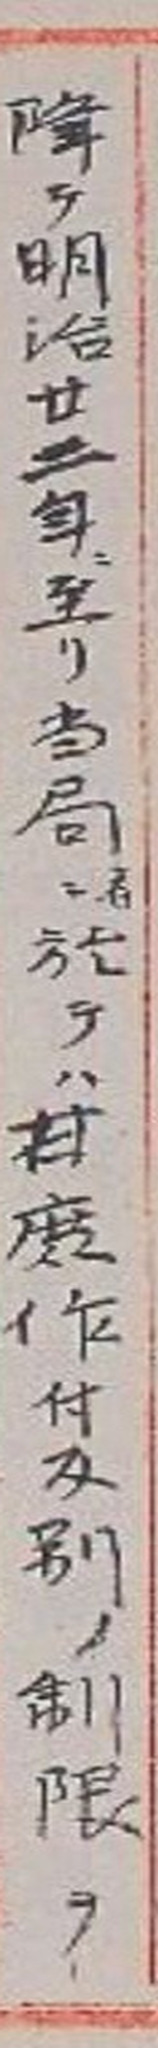降テ明治廿二年ニ至リ当局者ニ於テハ甘庶作付反別ノ制限ヲ
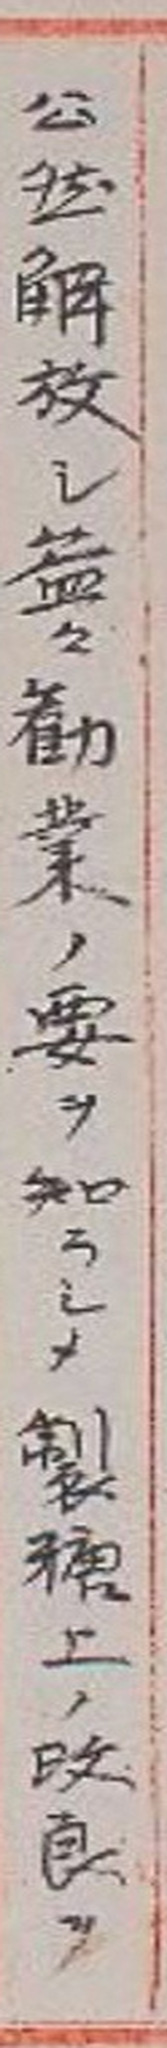公然解放シ益々勧業ノ要ヲ知ラシメ製糖上ノ改良ヲ
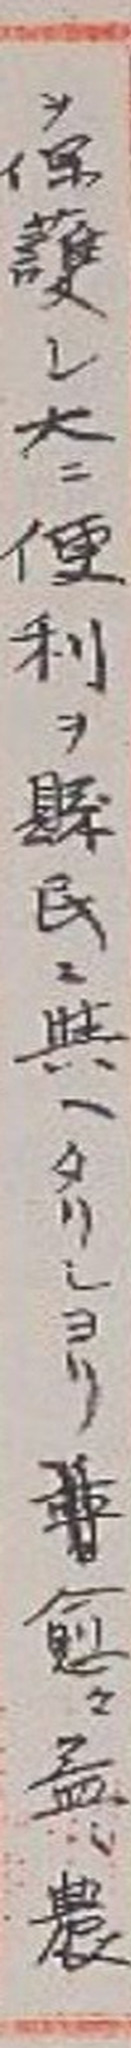ヲ保護シ大ニ便利ヲ県民ニ与ヘタリシヨリ愈々益農
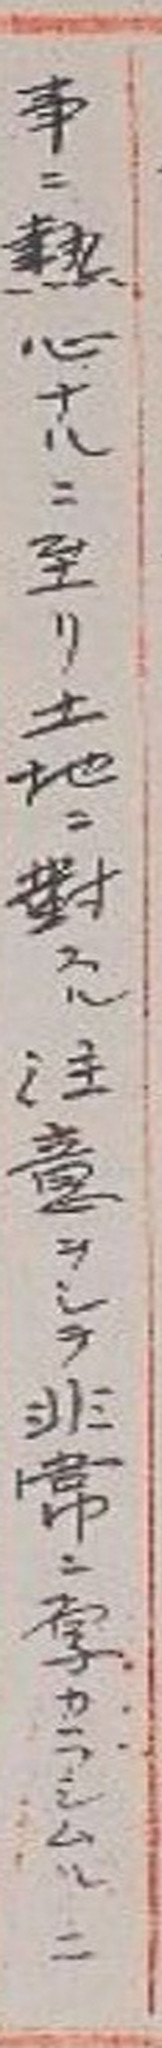事ニ熱心ナルニ至リ土地ニ対スル注意ヲシテ非常ニ厚カラシムルニ
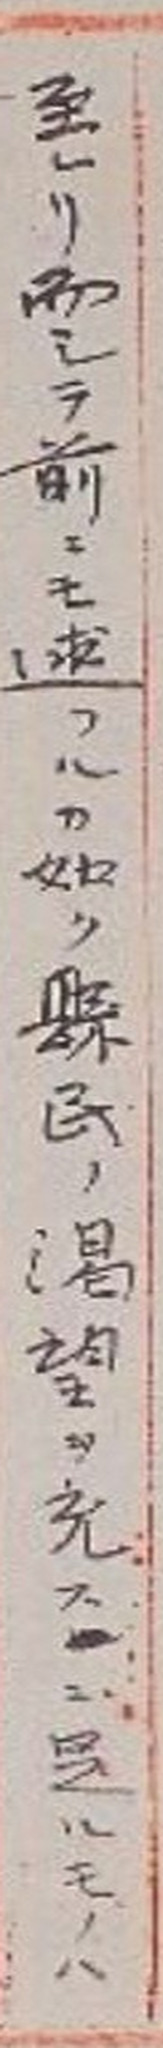至レリ而シテ前ニモ述フルカ如ク県民ノ渇望ヲ充スニ足ルモノハ
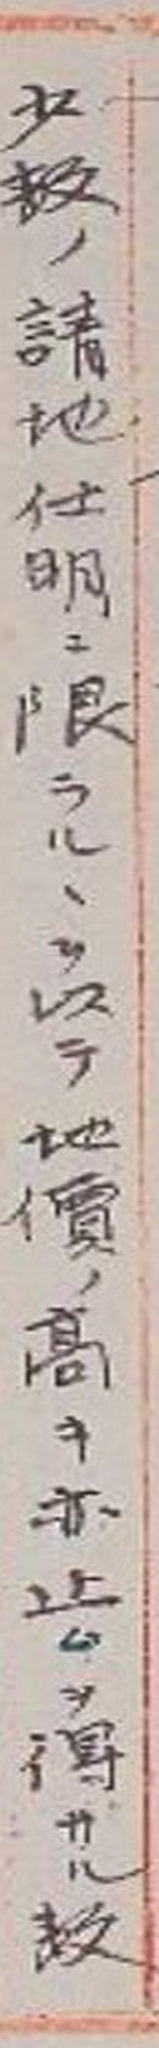少数ノ請地仕明ニ限ラルヽヲ以テ地価ノ高キ亦止ムヲ得サル数
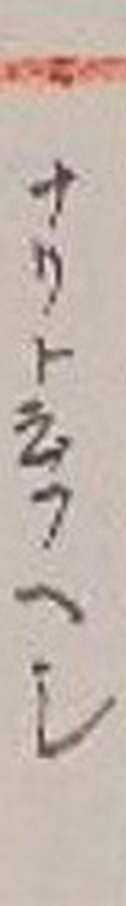ナリト云フヘシ
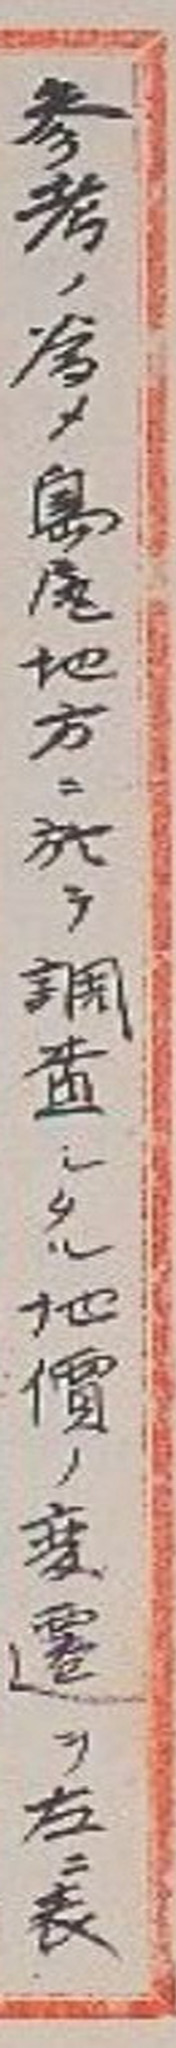参考ノ為メ島尻地方ニ於テ調査シタル地価ノ変遷ヲ左ニ表
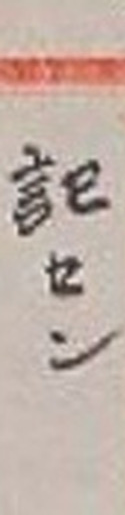記セン
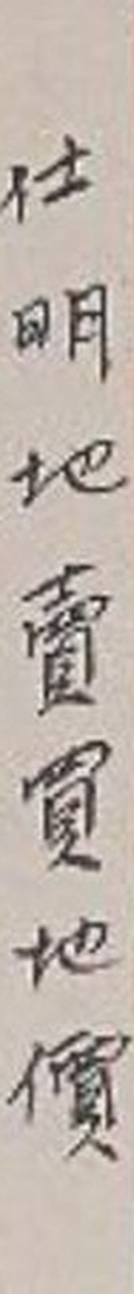仕明地売買地価
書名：本県地価ノ高キ理由調書
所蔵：University of the Ryukyus Library
